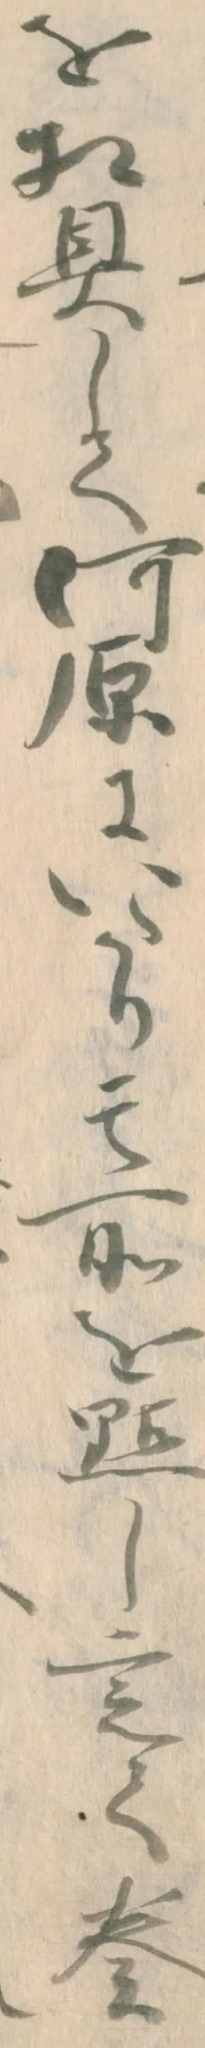を相具して河原にいたり其所を点し定て奏
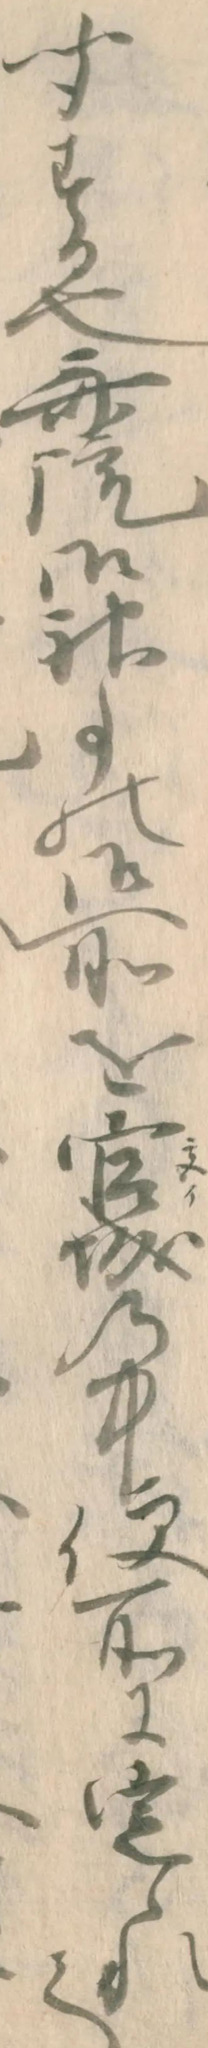聞する也斎院御神事の御所を官城の中便所に定られて
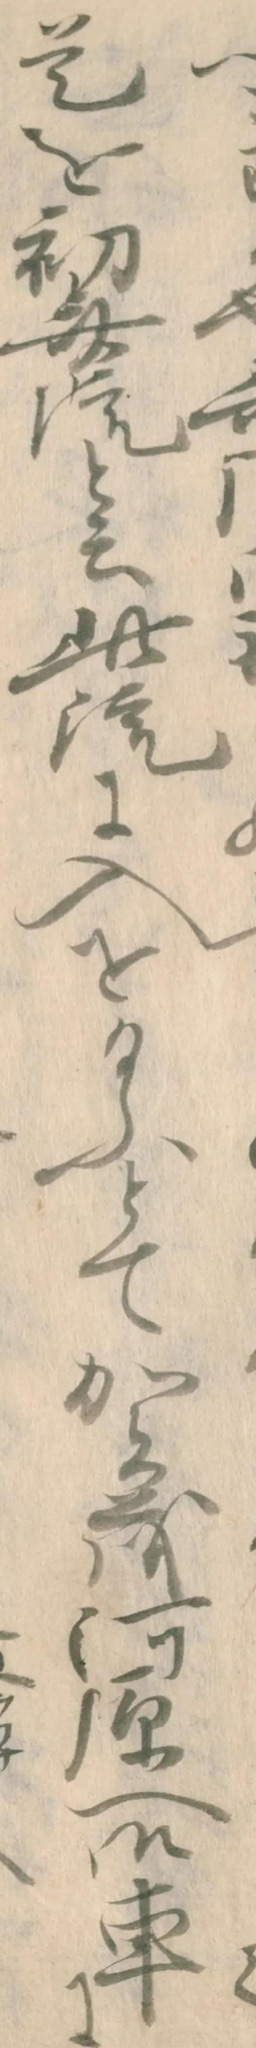是を初斎院と云此院に入せ給ふとて賀茂河原へ御車に
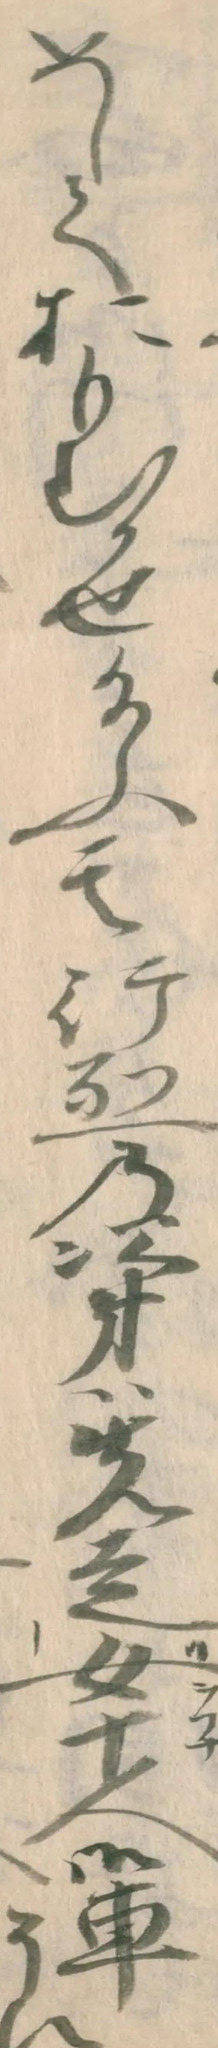めしておもむかせ給ふ其行烈の次第は先走-女十人御車そひ
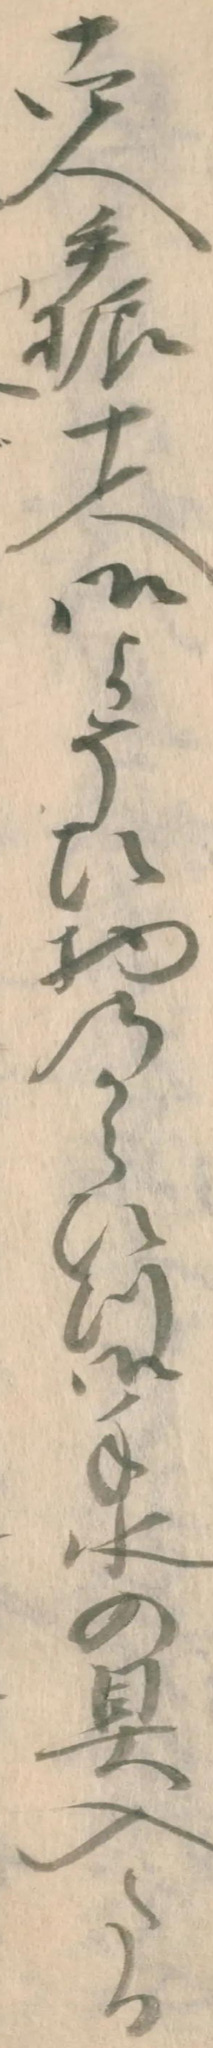十四人手-振十人御よそひ物のからひつ御手水の具入たる
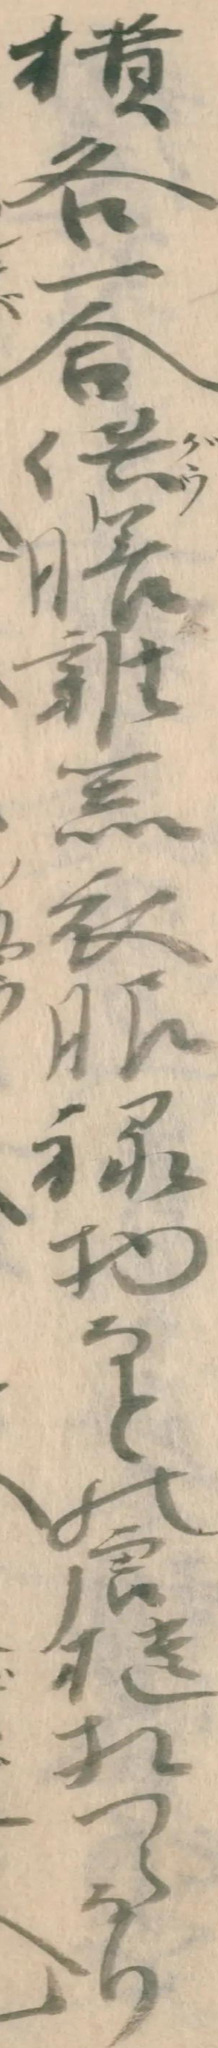櫃各一合供-膳雑器衣服禄物なとの唐櫃相つらなり
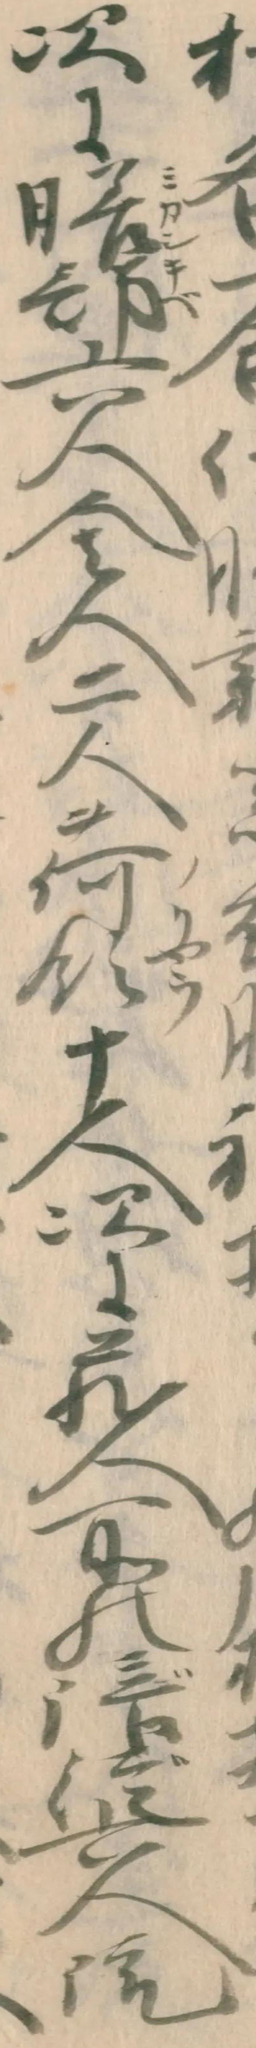次に膳部六人舎人二人荷領十人次に蔵人所の陪従六人院
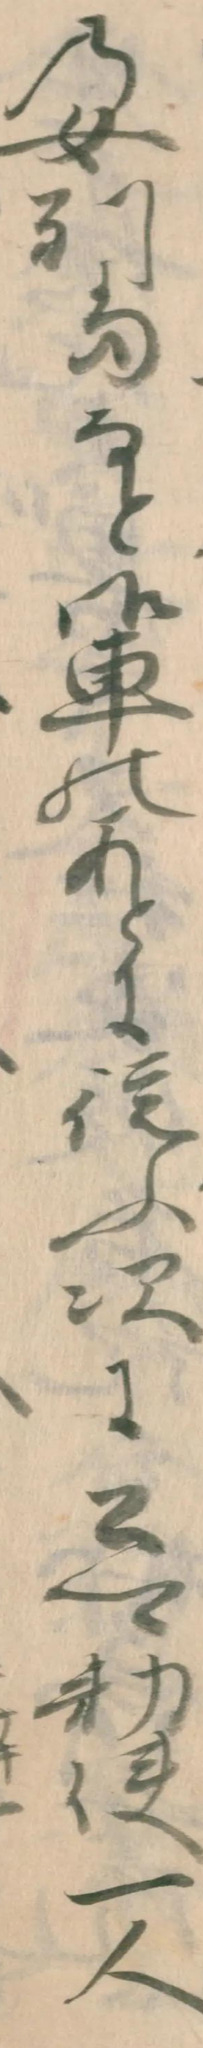の女別当なと御車のあとに従ふ次に公卿勅使一人
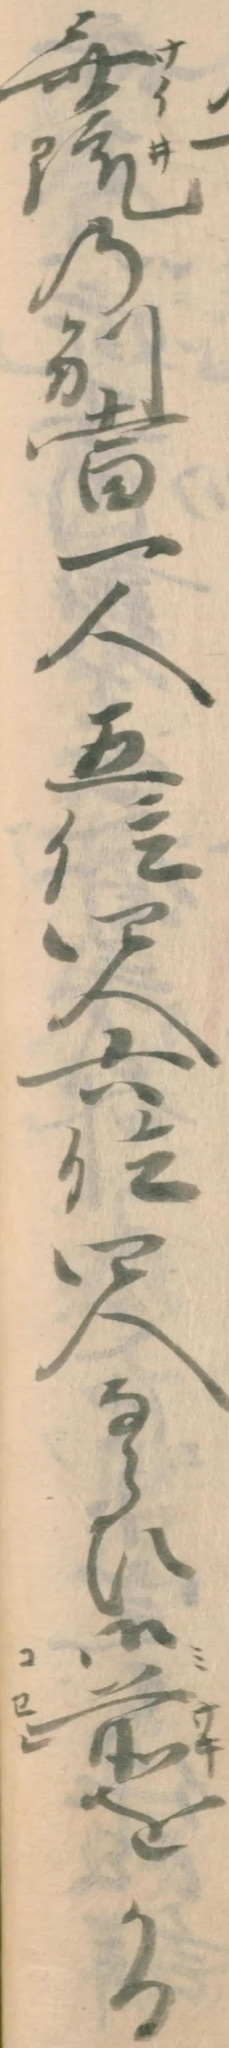斎院の別當一人五位四人六位四人ならひ御前をかる
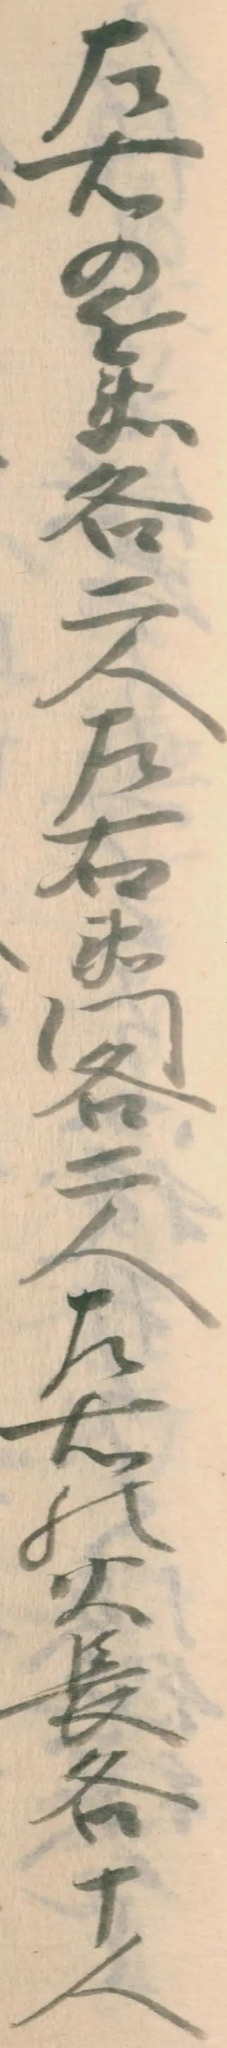左右の近衛各二人左右衛門各二人左右の火長各十人
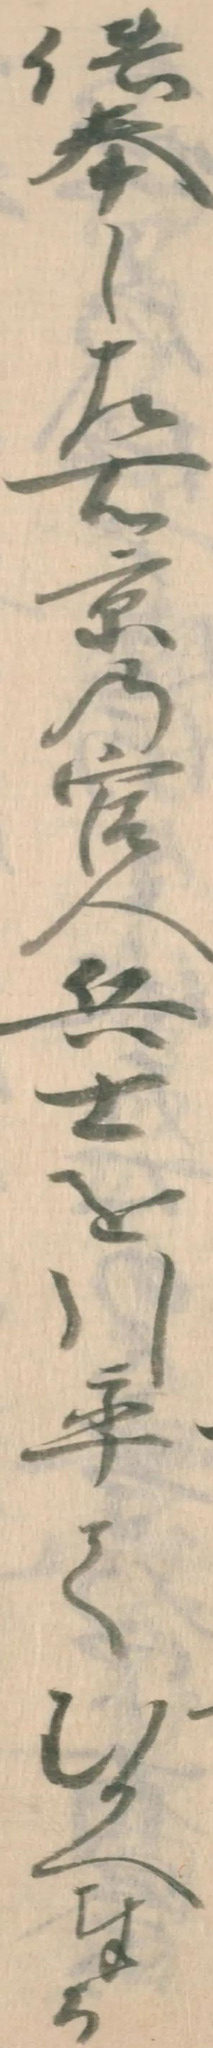供奉し左右京の官人兵士を引率てむかへ奉る
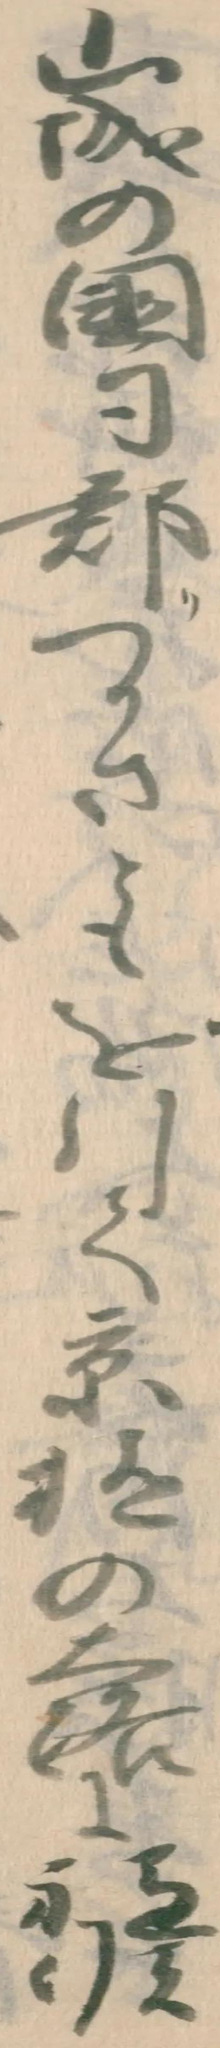山城の国司郡引て京極の大路に祗候
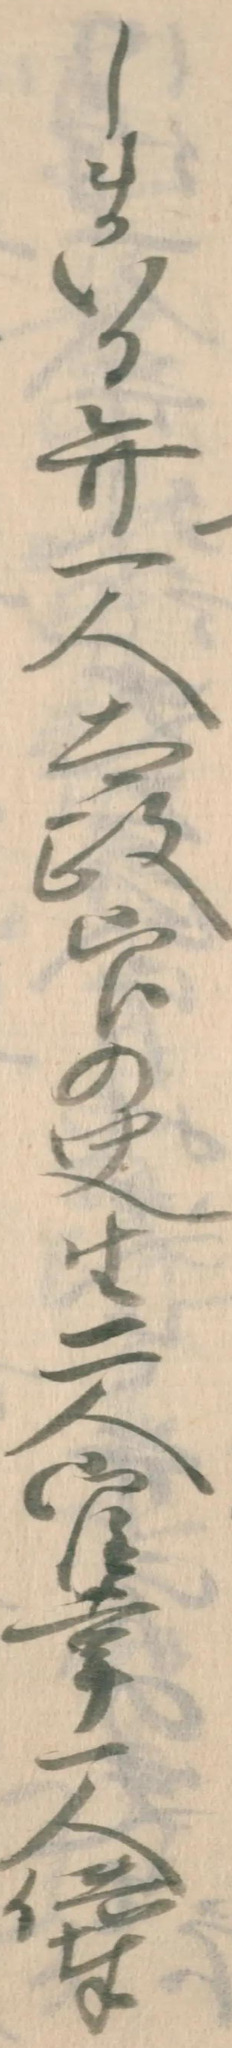しまいる弁一人太政官の史生二人官掌一人供奉
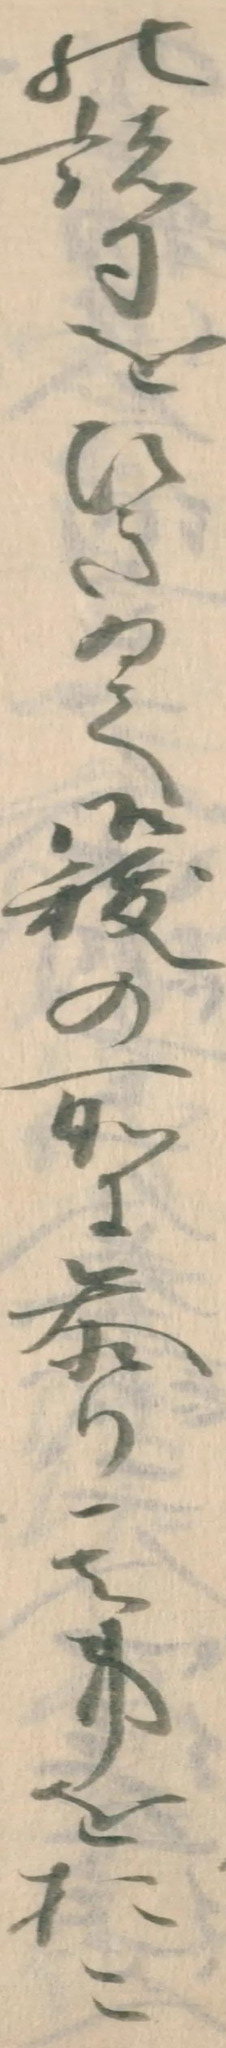の諸司をひきゐて御祓の所に参り其事をおこ
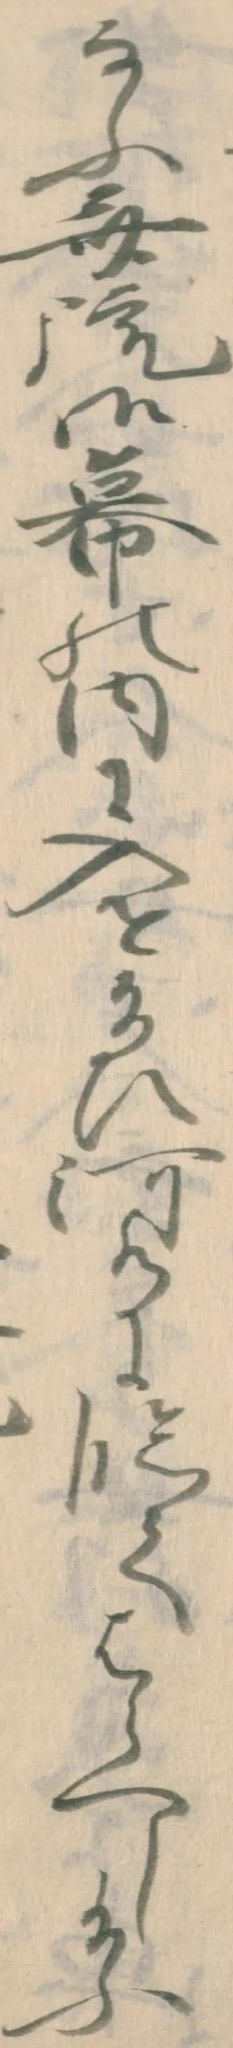なふ斎院御幕の内に入せ給ひ河水に臨てはらへし給ふ
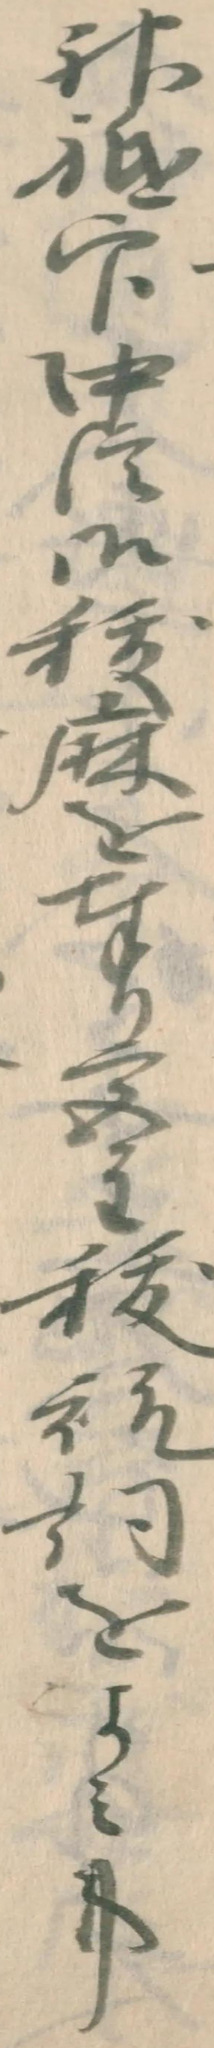神祇官中臣御祓麻を奉り宮主祓祝詞をよみ事
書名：賀茂社記録. 第1冊
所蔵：国立国会図書館 National Diet Library, JAPAN
